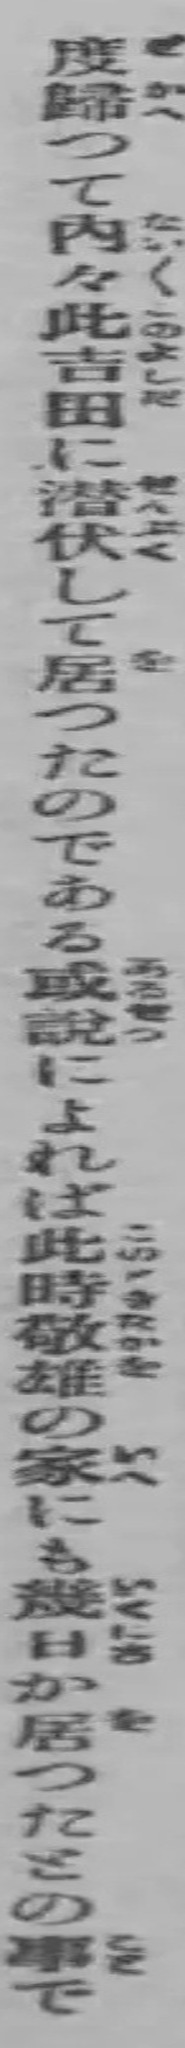度帰つて内々此吉田に潜伏して居つたのである或説によれば此時敬雄の家にも幾日か居つたとの事で
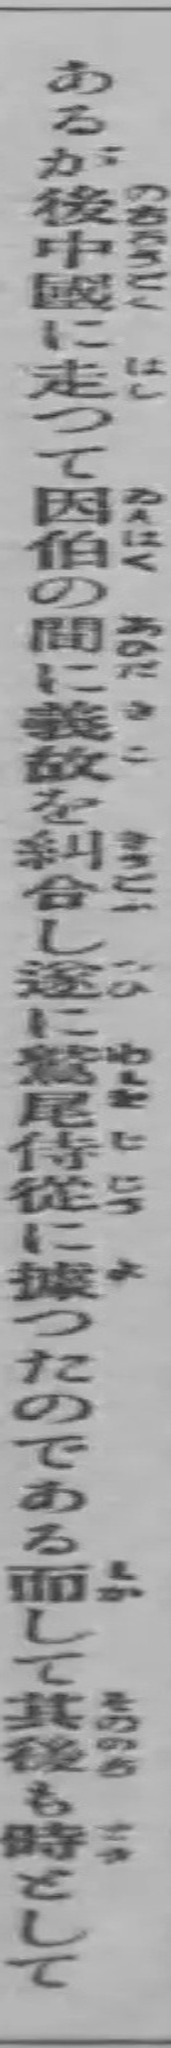あるが後中国に走つて因伯の間に義故を糾合し遂に鷲尾侍従に拠つたのである而して其後も時として
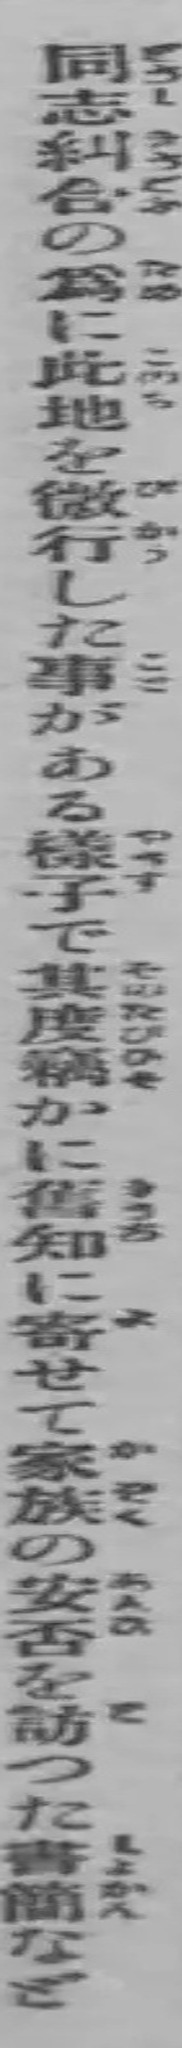同志糾合の為に此地を微行した事がある様子で其度竊かに旧知に寄せて家族の安否を訪つた書簡など
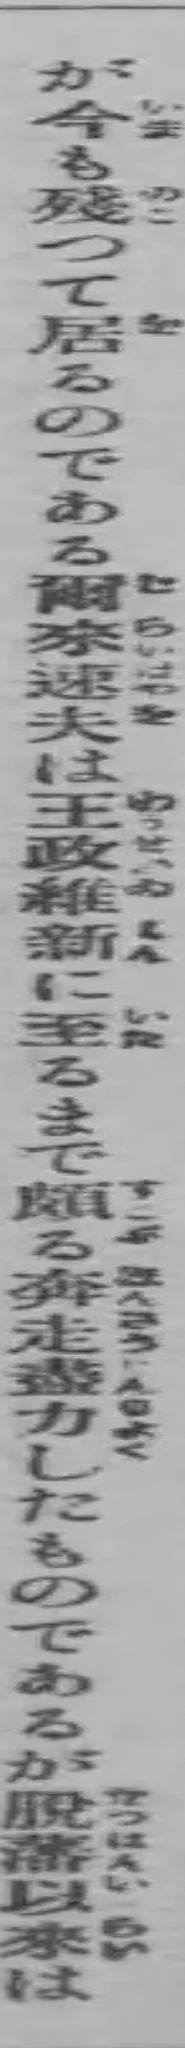が今も残つて居るのである爾来速夫は王政維新に至るまで頗る奔走尽力したものであるが脱藩以来は
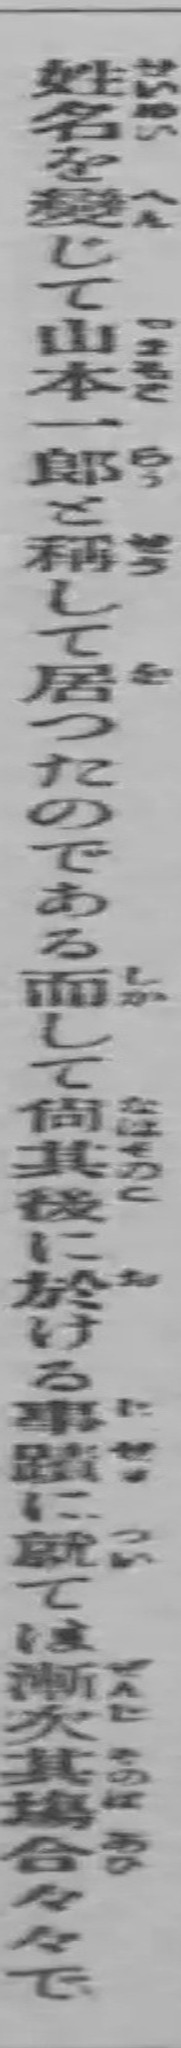姓名を変じて山本一郎と称して居つたのである而して尚其後に於ける事蹟に就ては漸次其場合々々で
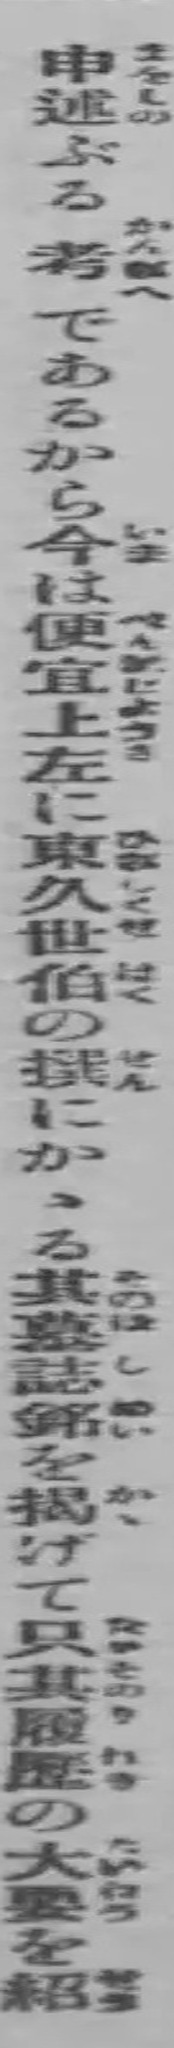申述ぶる考であるから今は便宜上左に東久世伯の撰にかゝる其墓誌銘を掲げて只其履歴の大要を紹
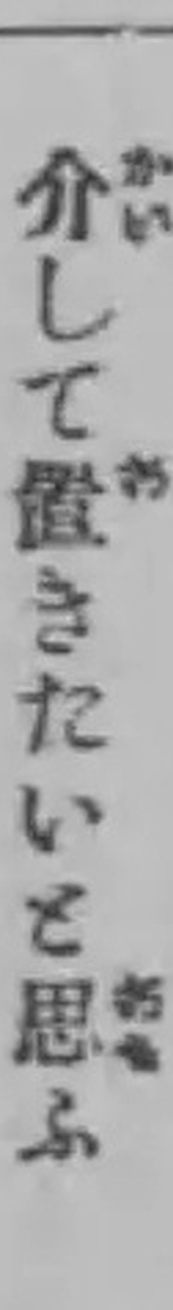介して置きたいと思ふ
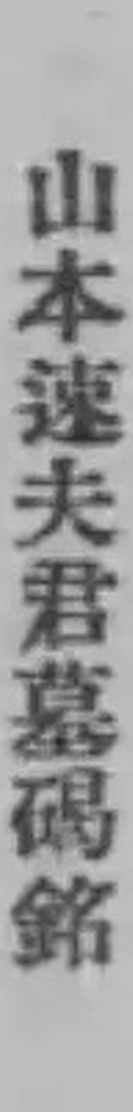山本速夫君墓碣銘
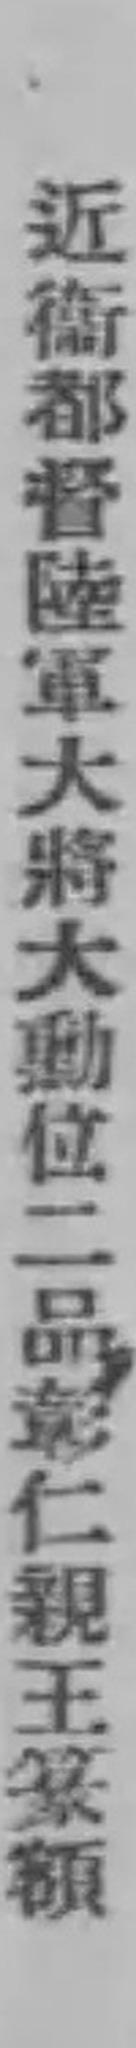近衛都督陸軍大将大勲位二品彰仁親王篆額
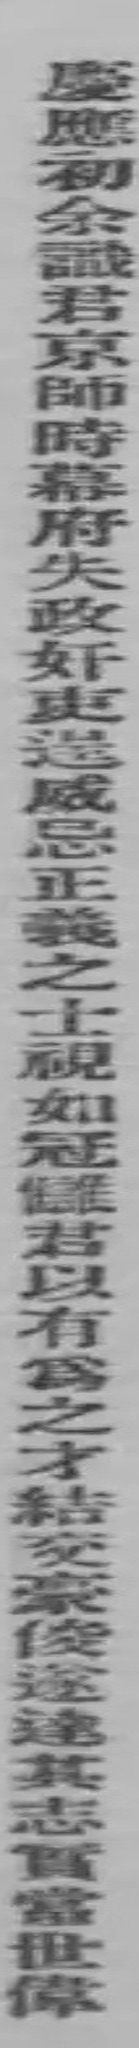慶応初余識君京師時幕府失政奸吏逞威忌正義之士視如冠讎君以有為之才結交豪俊遂達其志実当世偉
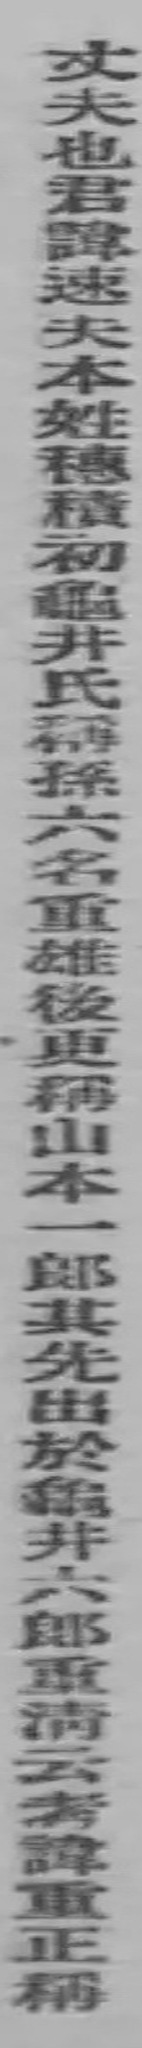丈夫也君諱速夫本姓穂積初亀井氏称孫六名重雄後更称山本一郎其先出於亀井六郎重清云考諱重正称
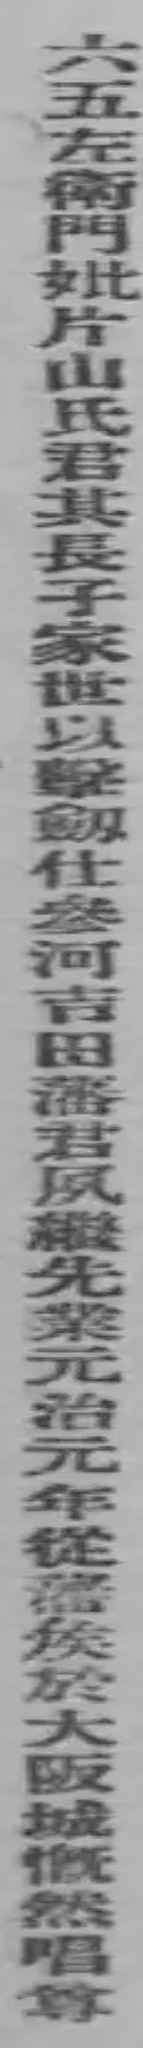六五左衛門妣片山氏君其長子家世以撃釼仕参河吉田藩君夙継先業元治元年従藩侯於大阪城慨然唱尊

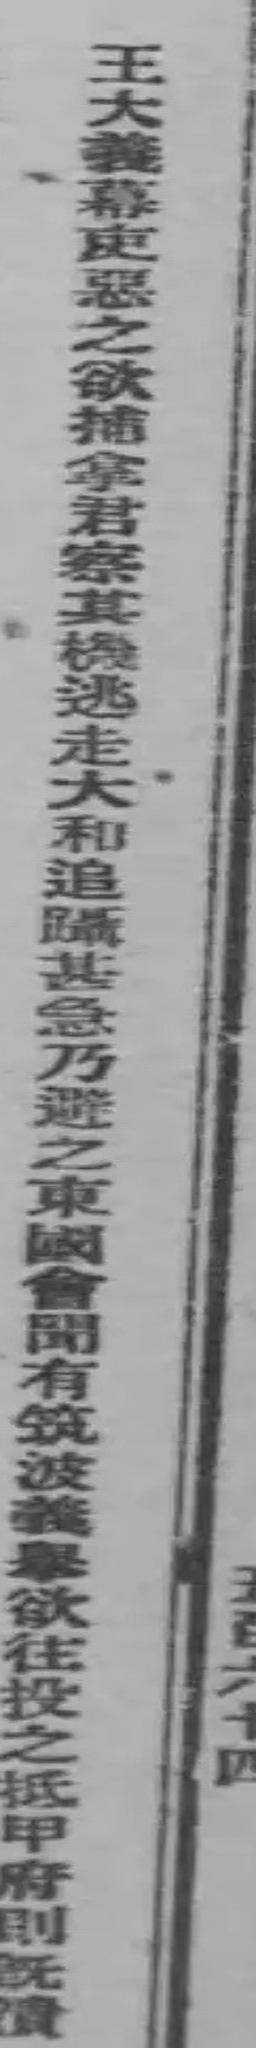王大義幕吏悪之欲捕拿君察其機逃走大和追躡甚急乃避之東国会聞有筑波義挙欲往投之抵甲府則既潰
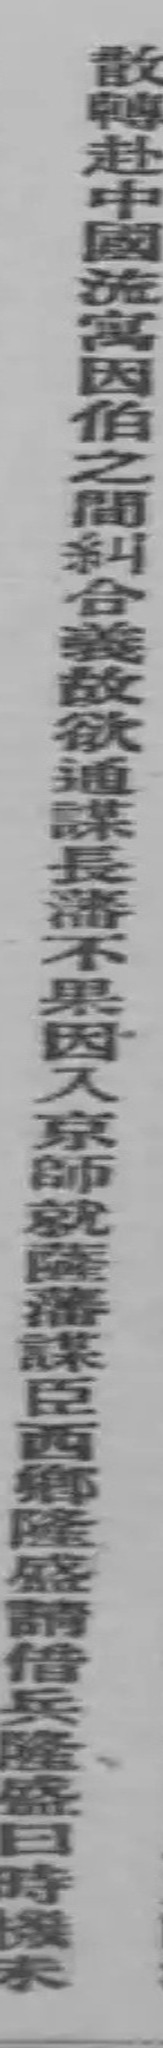散転赴中国流寓因伯之間糾合義故欲通謀長藩不果因入京師就薩藩謀臣西郷隆盛請借兵隆盛日時機末
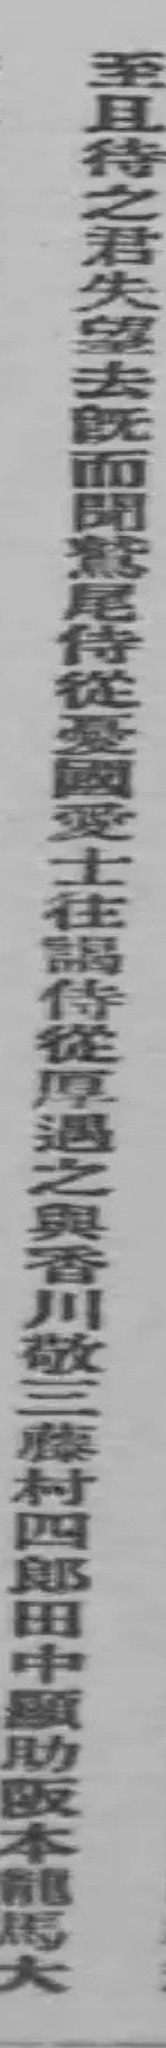至且待之君失望去既而聞鷲尾侍従憂国愛士往謁侍従厚遇之与香川敬三藤村四郎田中顕助坂本龍馬大
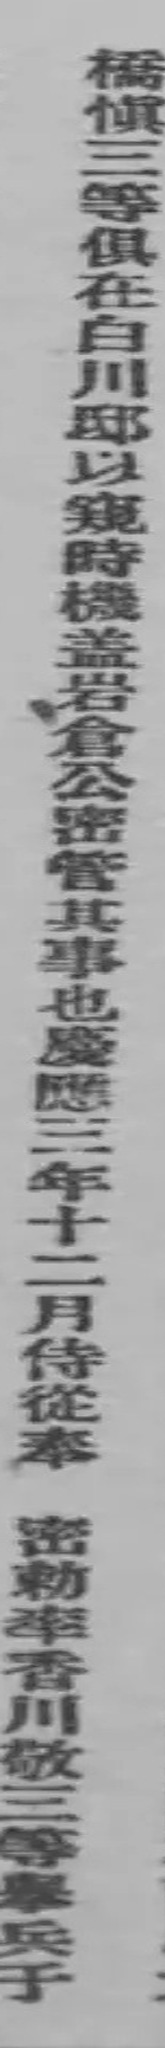橋慎三等俱在白川邸以窺時機盖岩倉公蜜管其事也慶応三年十二月侍従奉蜜勅率香川敬三等挙兵于
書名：豊橋市史談
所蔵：国立国会図書館 National Diet Library, JAPAN
